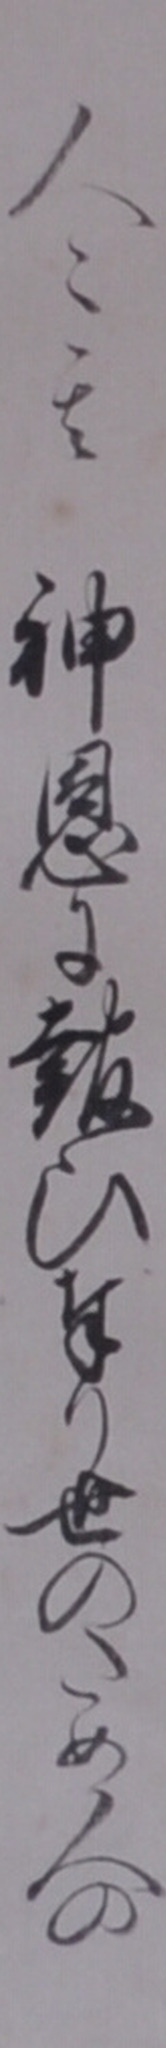人々其神恩に報ひ奉り世のため人の
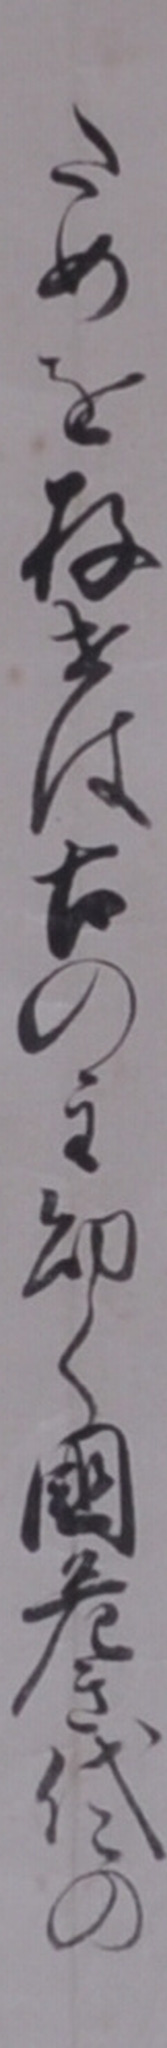ためを存せは古の主幼く国危き代々の
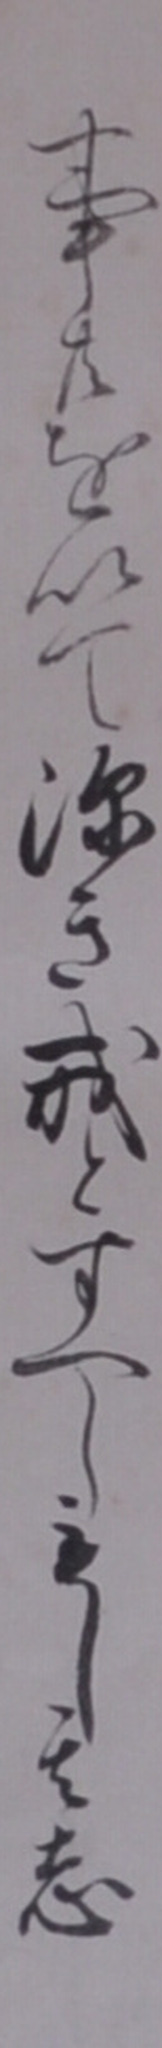事共を以て深き戒とすへしもし其志
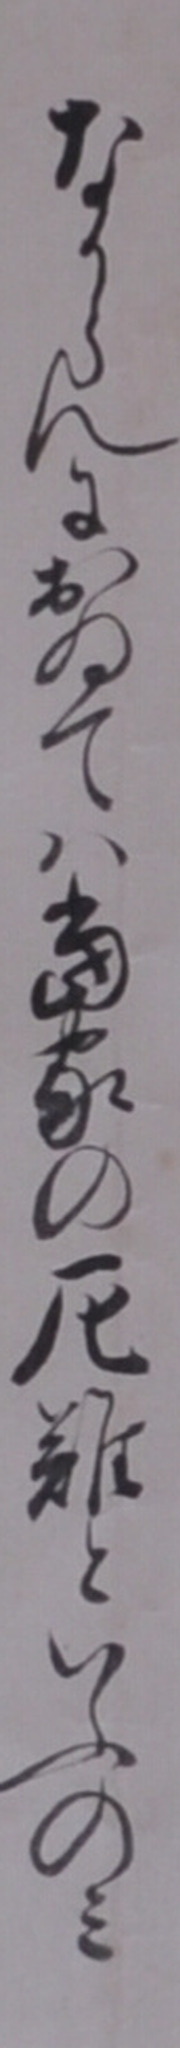なからんにおゐては当家の厄難といふのみ
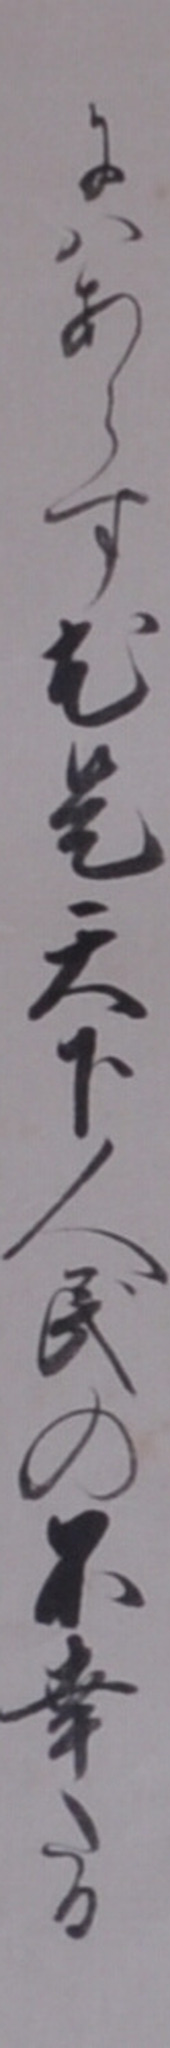にはあらす尤是天下人民の不幸たる
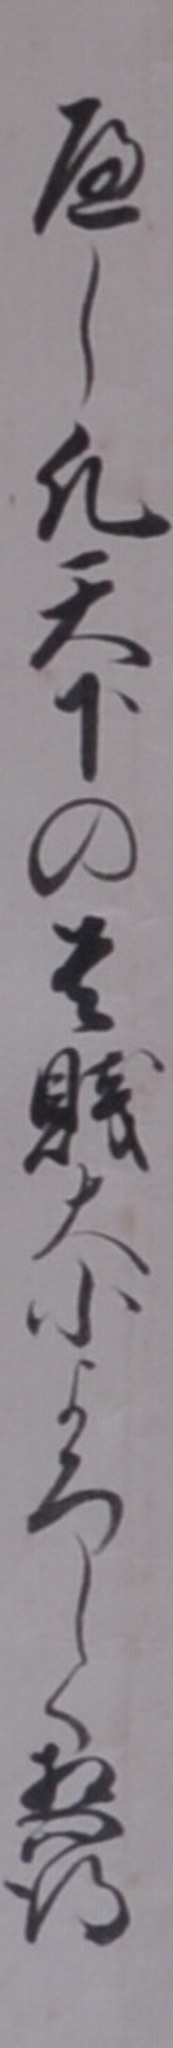へし凡天下の貴賤大小よろしく相心得
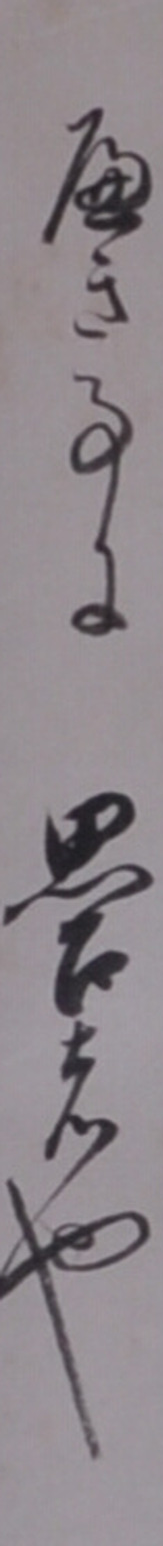へき事に思召者也
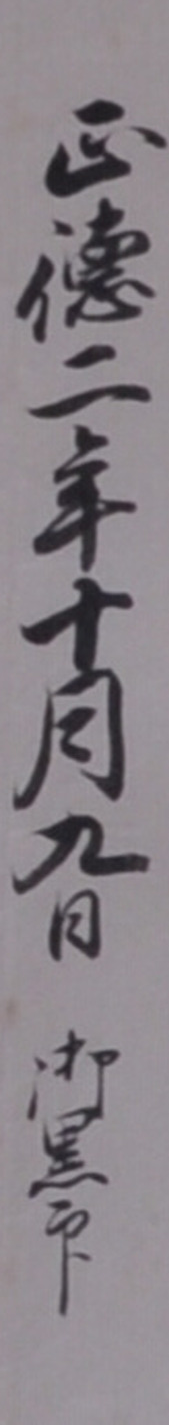正徳二年十月九日御黒印
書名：御書付之写
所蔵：伊那市立高遠町図書館・合同会社AMANE
